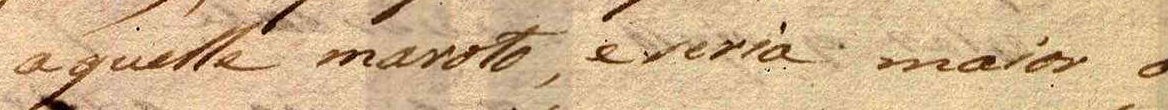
aquelle maroto, e seria maior o
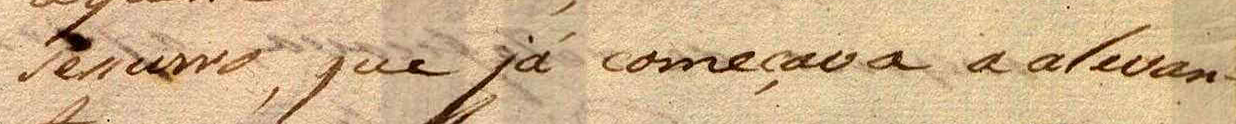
sessurro, que já começava a alevan
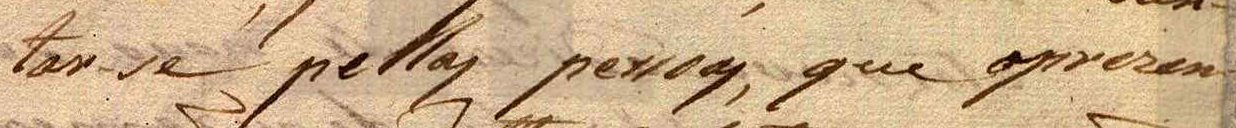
tar-se pellas pessoas, que a prezen
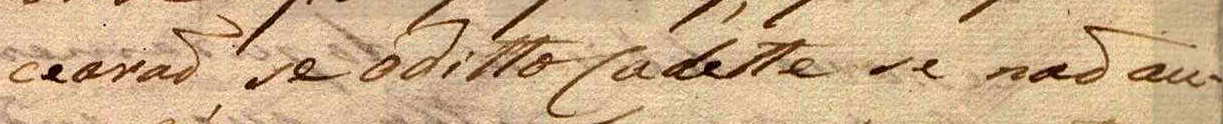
cearaõ se o ditto Cadette se naõ au
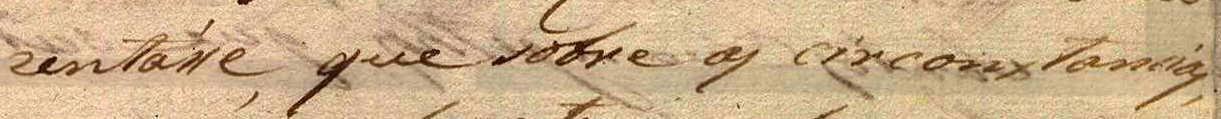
zentasse, que sobre as circonstancias,
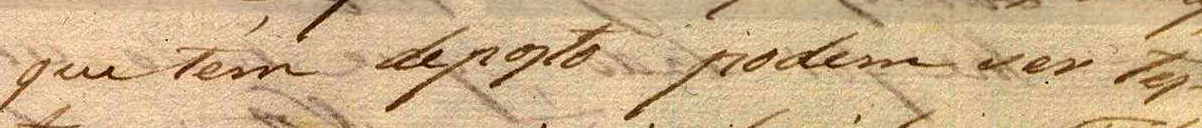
que tem deposto podem ser tes
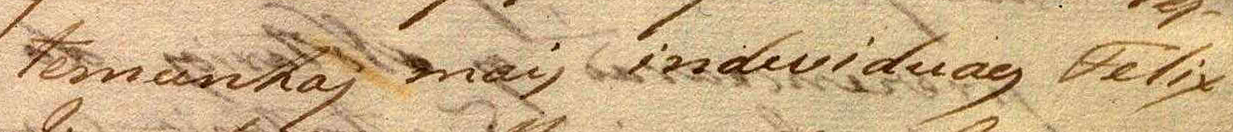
temunhas mais indeviduaes Felix
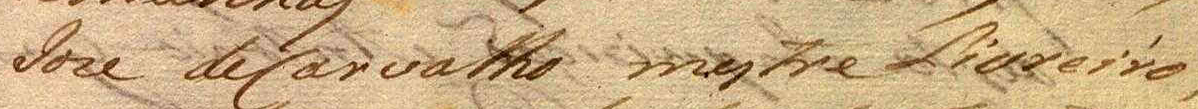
Ioze de Carvalho mestre Livreiro,
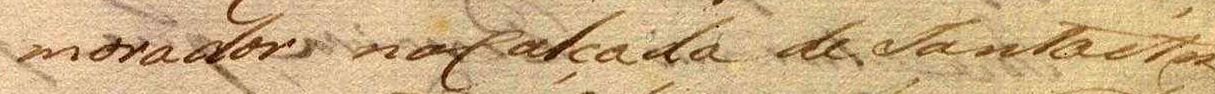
morador na Calçada de Santa An
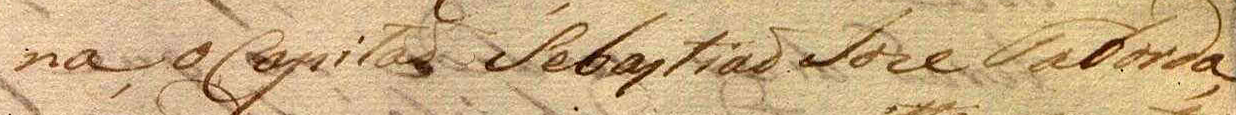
na, o Capitaõ Sebastiaõ Ioze Taborda,
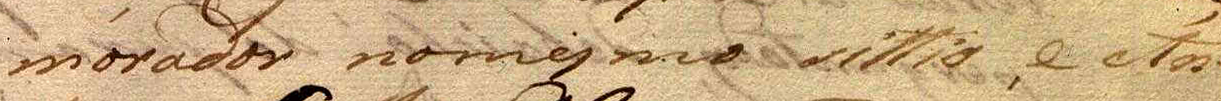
morador no mesmo sittio, e An
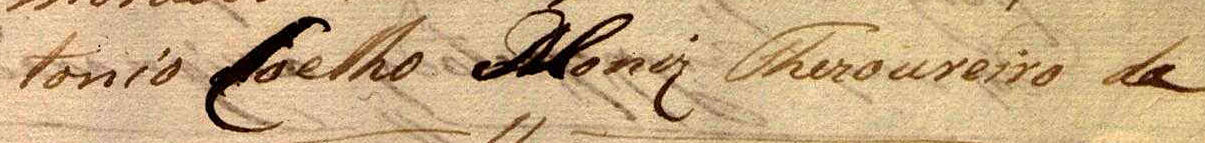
tonio Coelho Moniz Thezoureiro da
